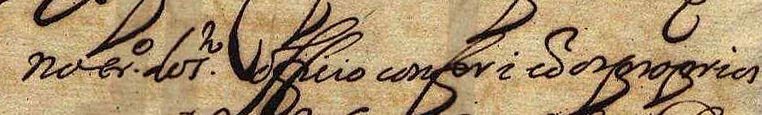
notr.o do s.to officio conferi cō os proprios
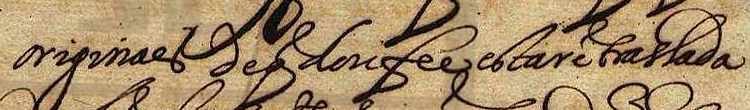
originaes de q̄ dou fee estarē traslada
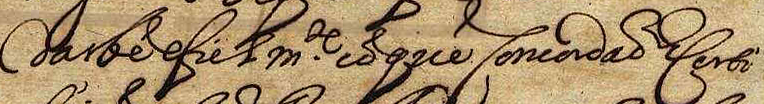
das bē e fielm.te cō quē Concordaõ E Certi
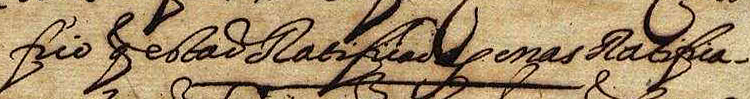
fico q̄ estaõ Ratificadas e nas Ratifica
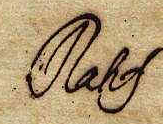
Ratif
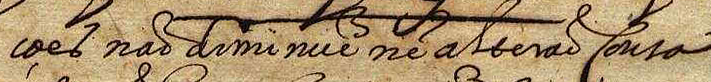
çoẽs não diminuē nē alteraõ Cousa
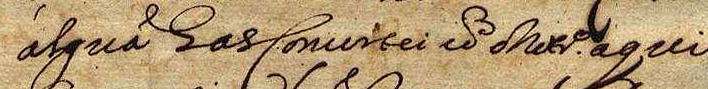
alguā E as Concertei cō o notr.o aqui
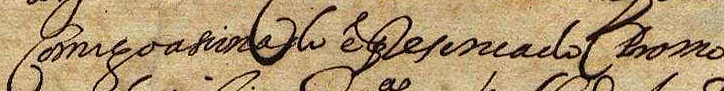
Comigo assinado ē presença do Promo
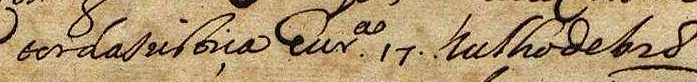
tor da Iustiça Eur.a 17. Iulho de 628
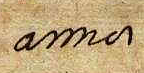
annos
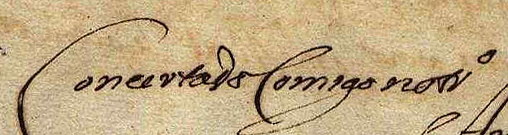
Concertado Comigo notro
